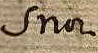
Snor
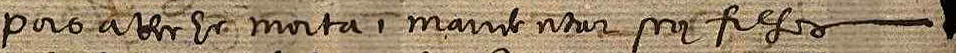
pois a Ree he morta , mande citar seꝯ filhos
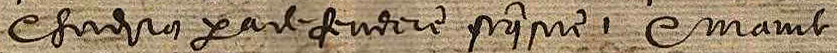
e herdjrꝯ ꝑa defenderē se q̄serē , e mande
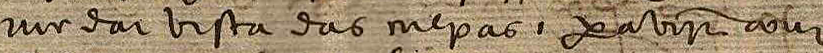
me dar vista das culpas , ꝑa vijr com
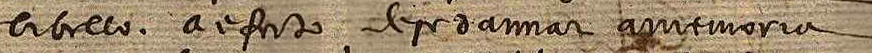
libello. a efeito de se dannar a memoria
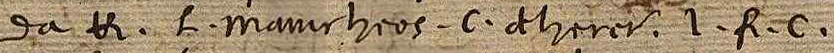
da R. L. manicheos .C. de heret. l. f. C.
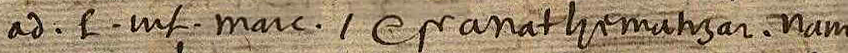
ad. L. inf. marc. / e se anathematizar. nam
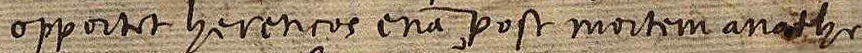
opportet hereticos etiā post mortem anathe
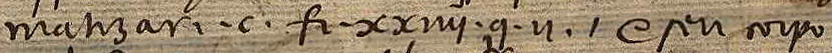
matizari .c. f. xxiiijo. q. ij. / e seu corpo
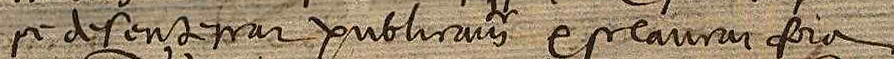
se desenterrar publicamte e se lançar fora
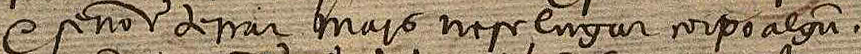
e se nō ēterrar majs nese lugar corpo algū.
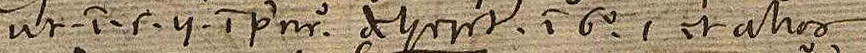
ut .ī. s. ij. ī p̄nco. de heret. ī 6o. i et alios
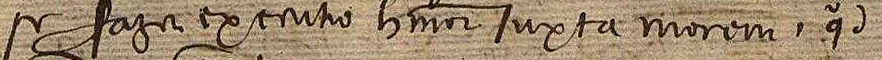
se fazer executio hm̄or Iuxta morem , q̄d
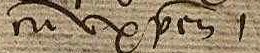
cū expēn /
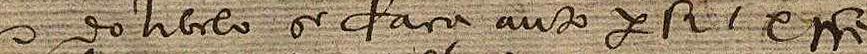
e do libelo se faça auto ꝑ si / e sse
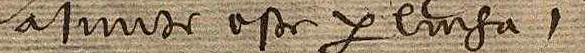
aJunte este ꝑ linha /
